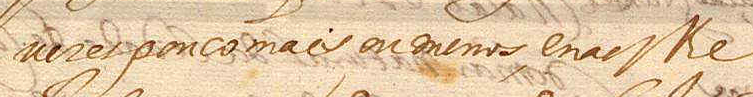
uezes pouco mais ou menos, e naõ lhe
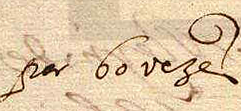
por 60 vezes
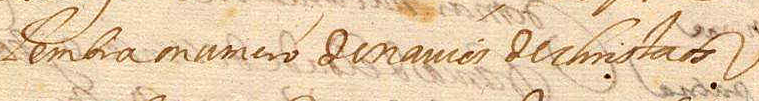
Lembra o numero de nauios de christaõs
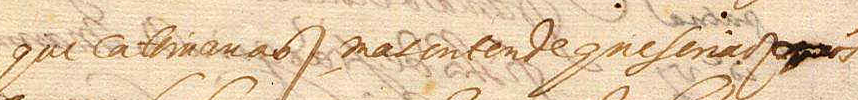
que cattiuauaõ mas entende que seriaõ xpaõs
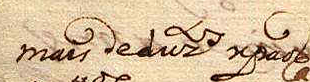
mais de duztos xpãos
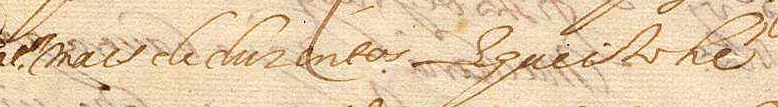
cat.os mais de duzentos - E que isto hé
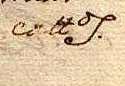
cattos.
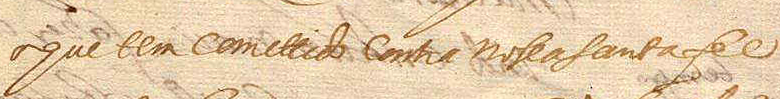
o que tem comettido contra nossa santa fee
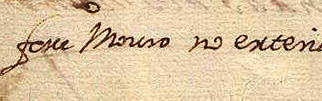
fesce Mouro no exterior
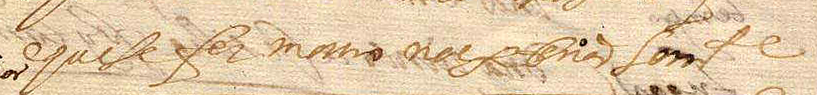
e que se fez mouro no exterior som.te
